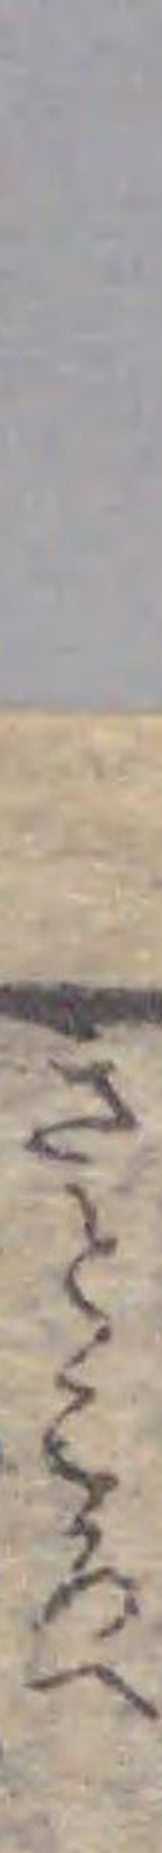きところへ
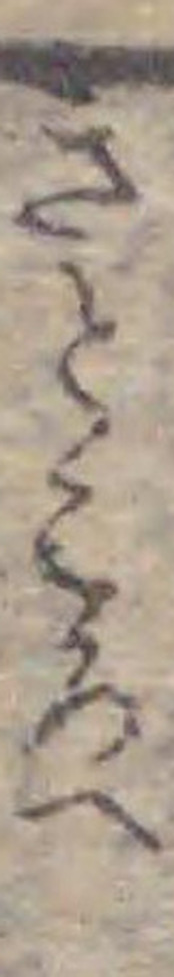きところへ
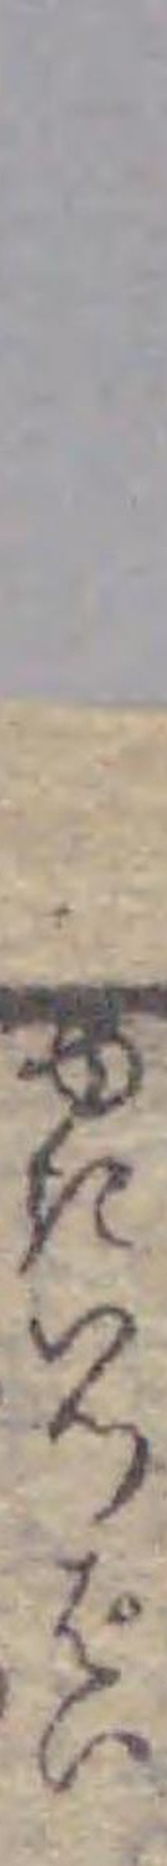ゆきいつぱい
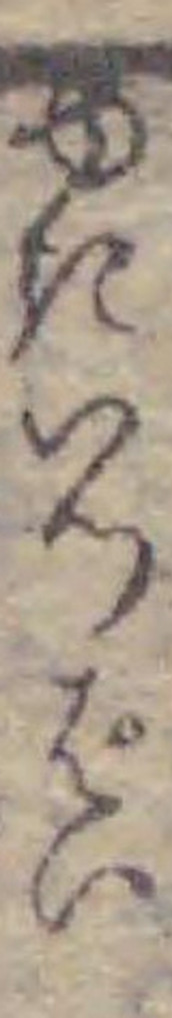ゆきいつぱい
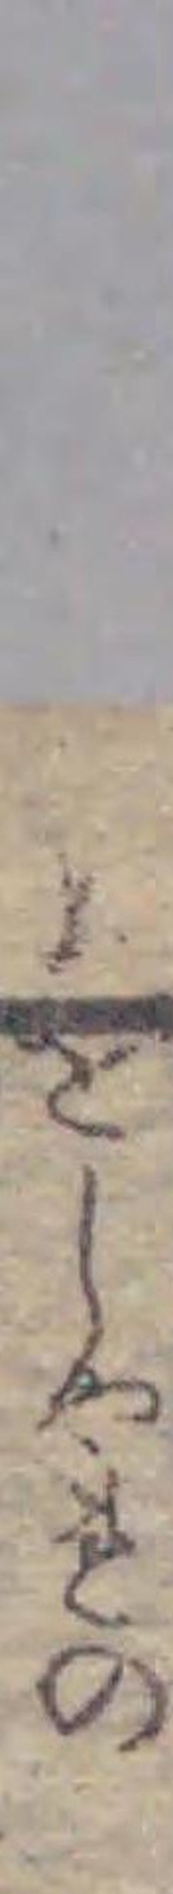をしやれの
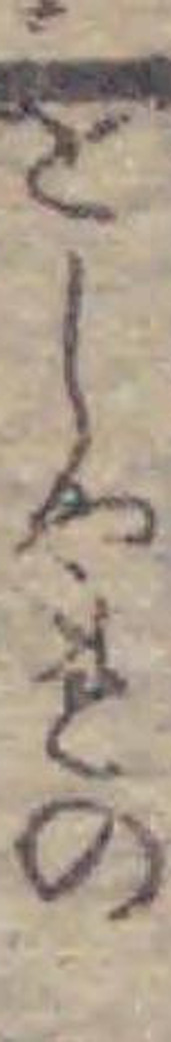をしやれの
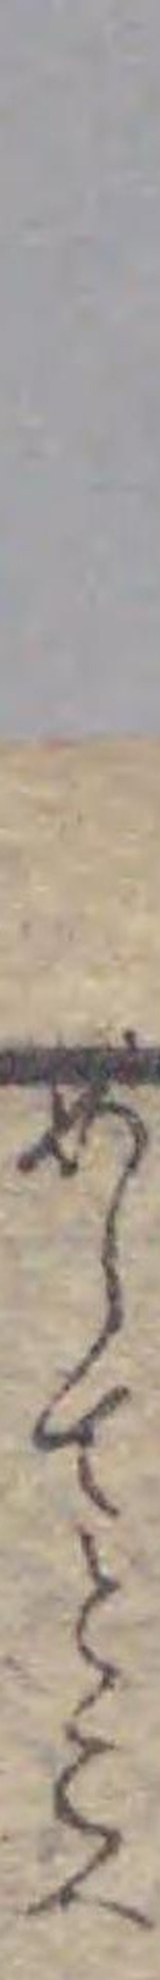めしてとこへ
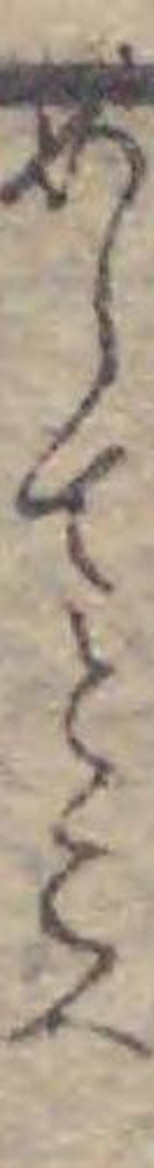めしてとこへ
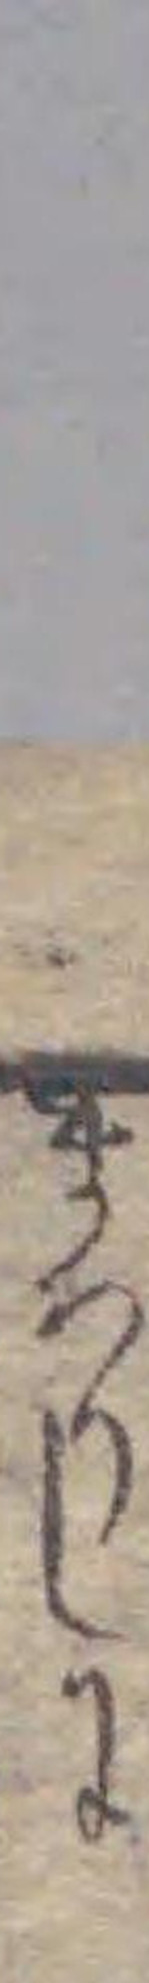まはりしに
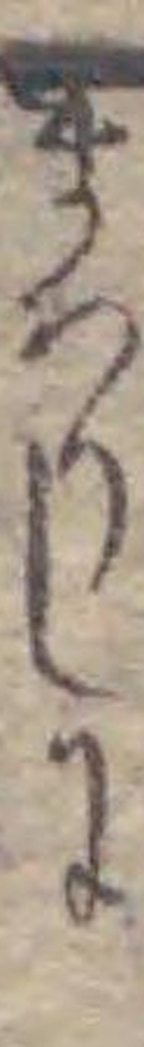まはりしに
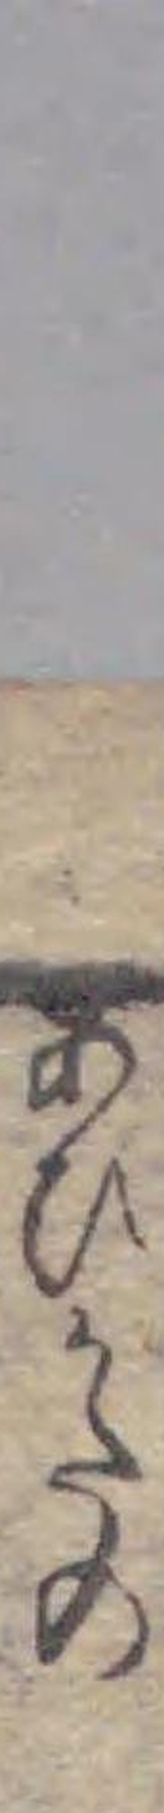あひかたの
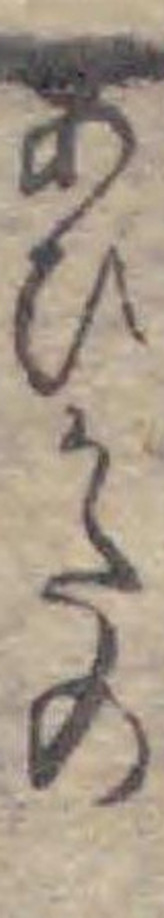あひかたの
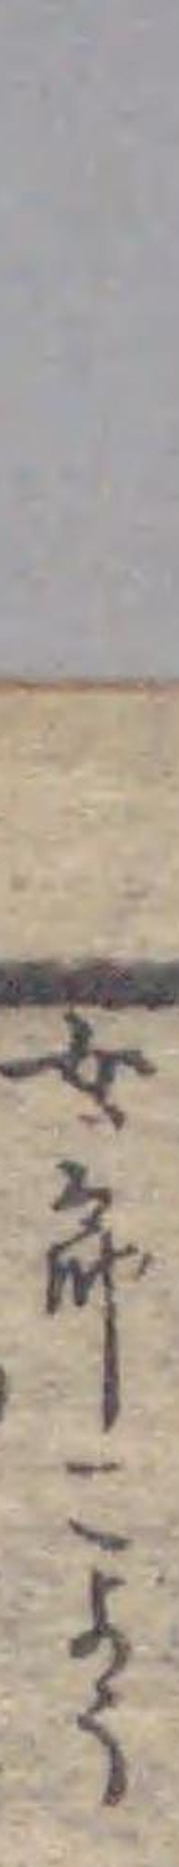女郎こよう
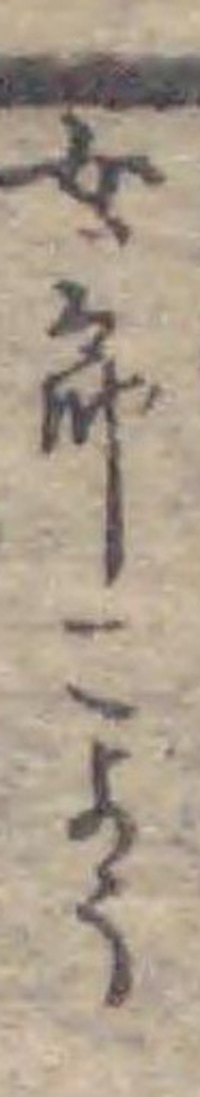女郎こよう
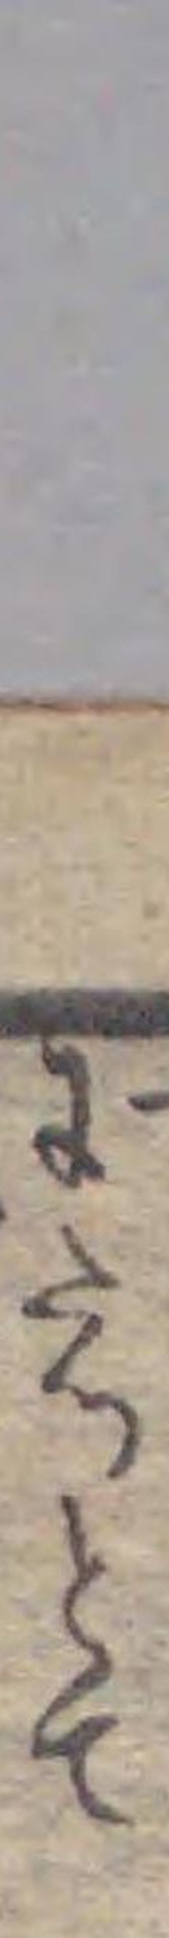にたつとて
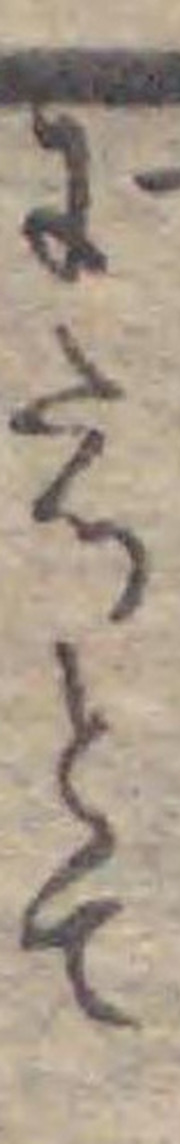にたつとて
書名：紺屋百物語 : 3巻
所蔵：国立国会図書館 National Diet Library, JAPAN
